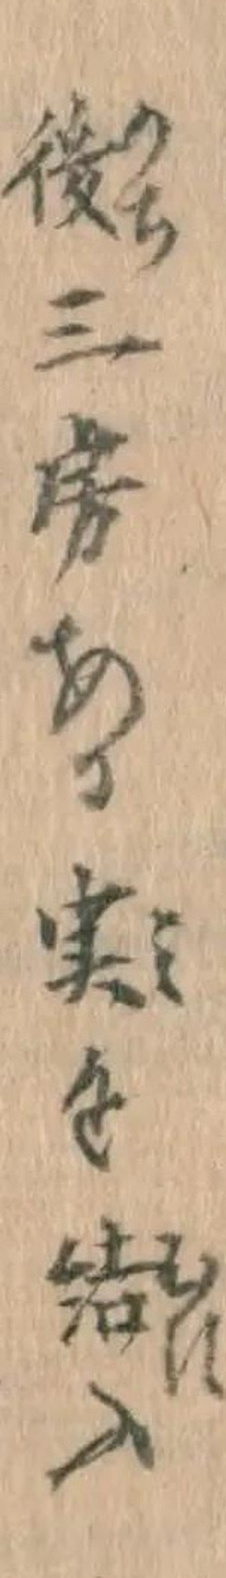後三房ある実を結ふ
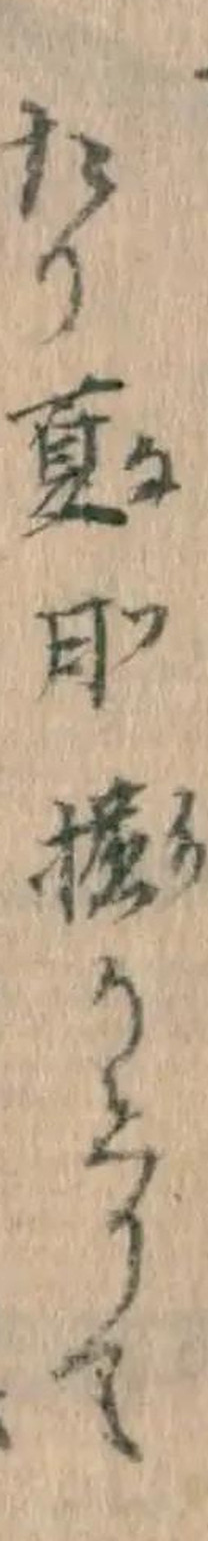たり夏月掘りとりて
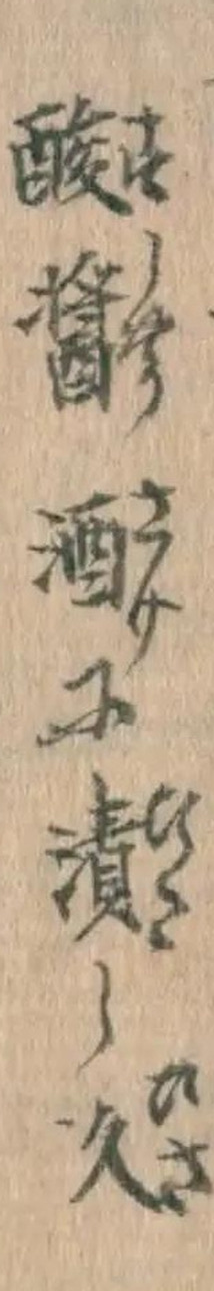酢醤酒に漬し久
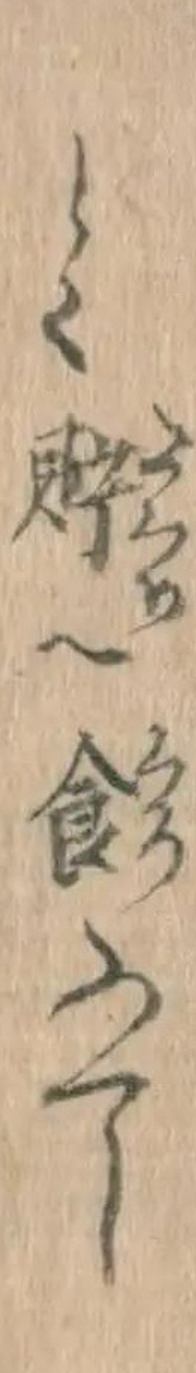しく貯へ食ふへし

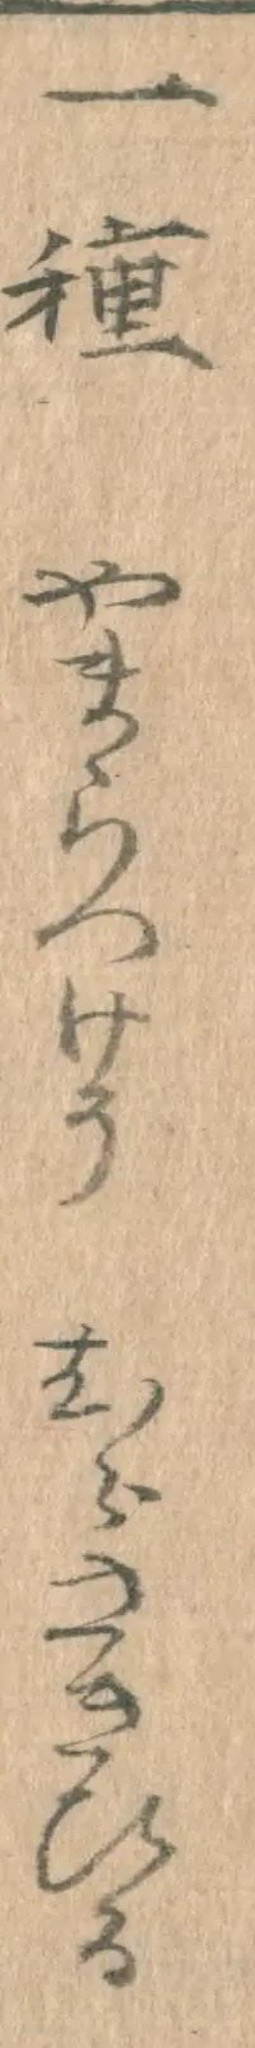一種やまらつけうむらさきひる
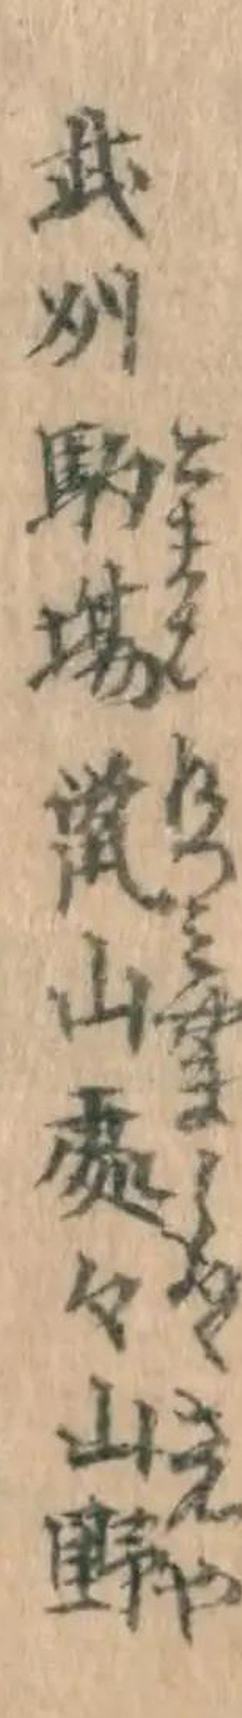武州駒場鼠山処々山野
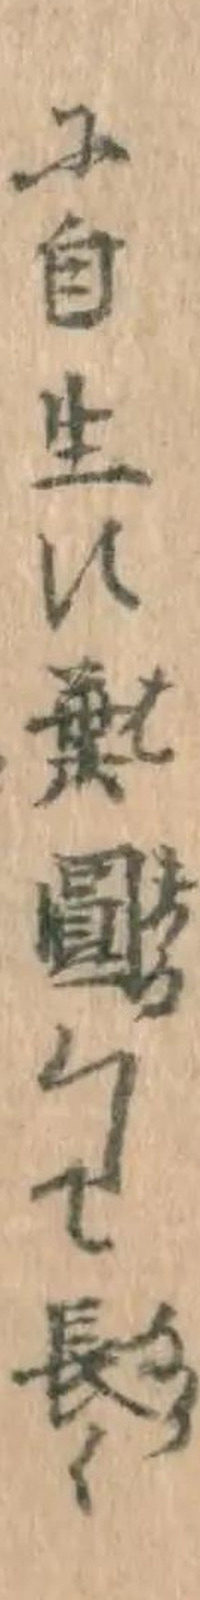に自生す葉円くして長く
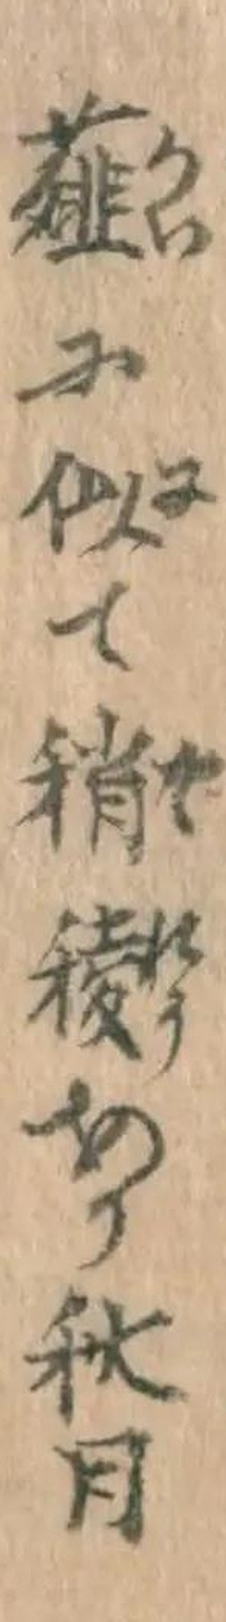薤に似て稍稜あり秋月
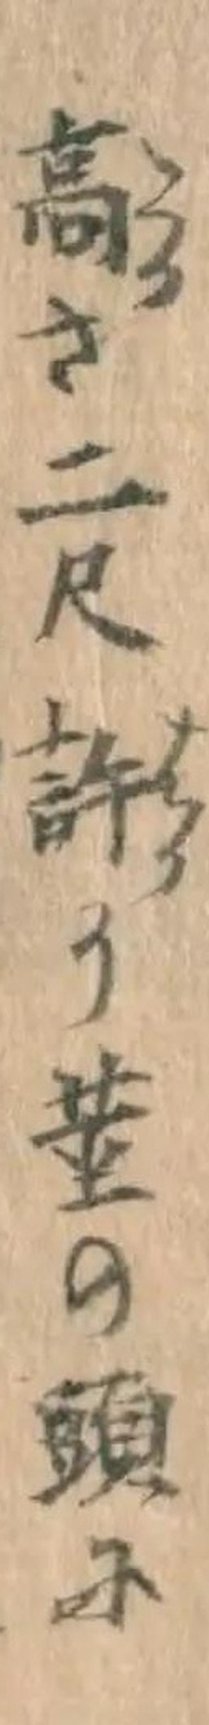高さ二尺許り茎の頭に
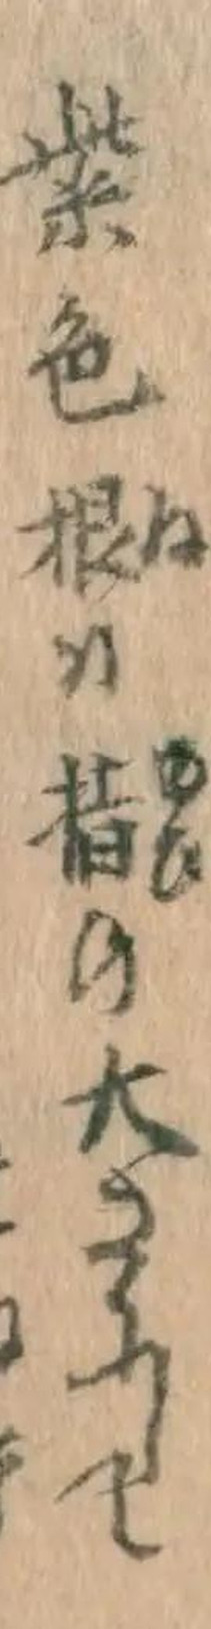紫色根は指の大さにして
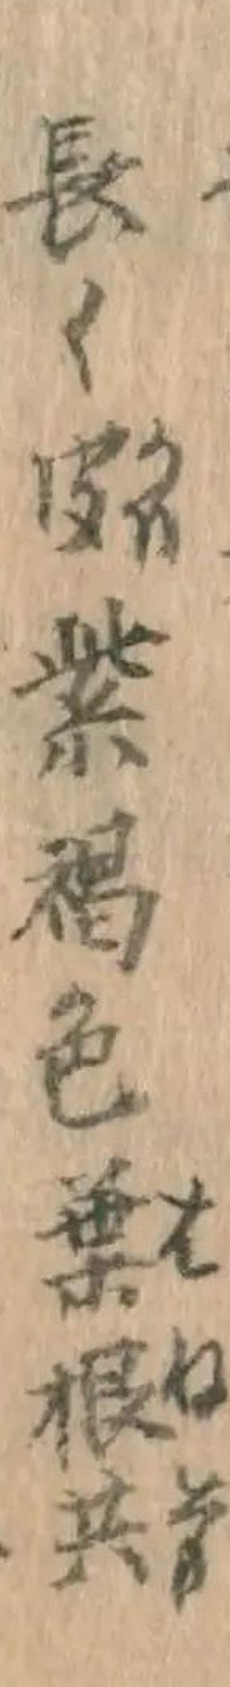長く皮紫褐色葉根共
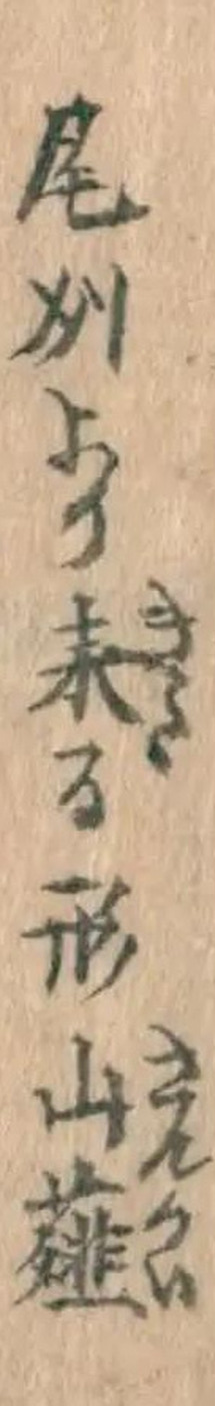尾州より来る形山薤
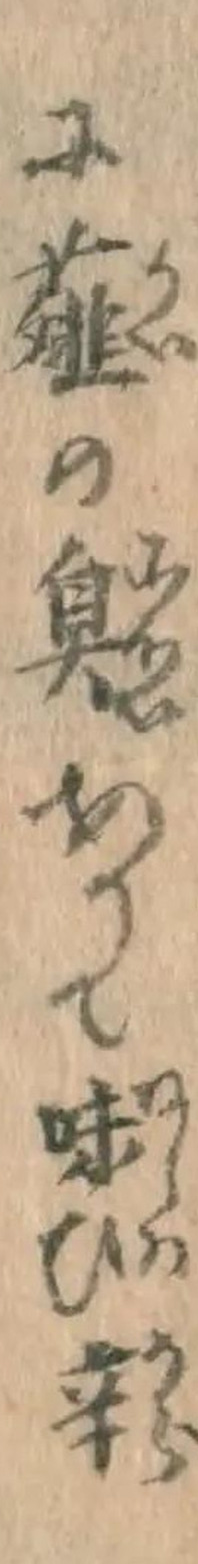に薤の臭ありて味ひ辛
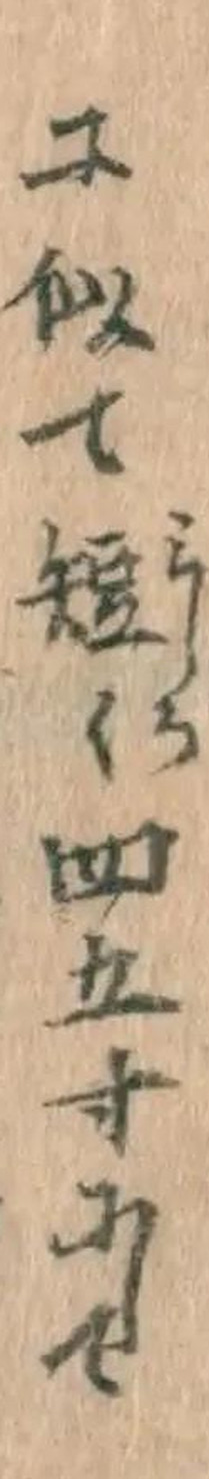に似て短く四五寸にして
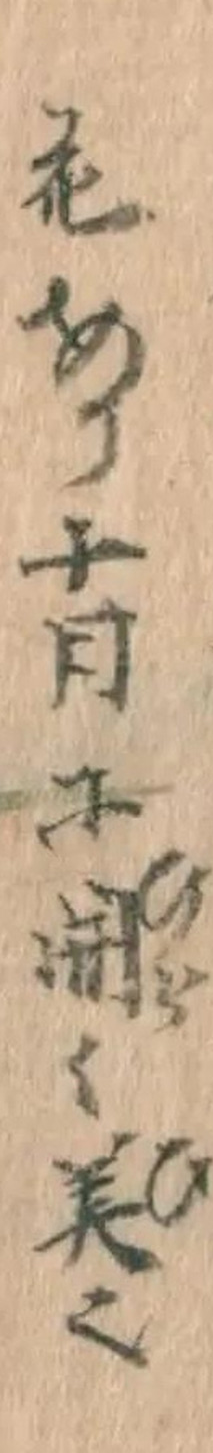花あり十月に開く美也

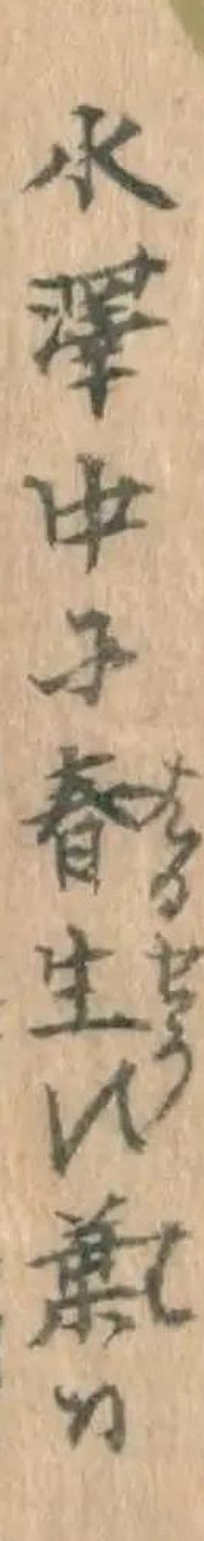水沢中に春生す葉は
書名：本草図譜. 巻43-45
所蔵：国立国会図書館 National Diet Library, JAPAN
